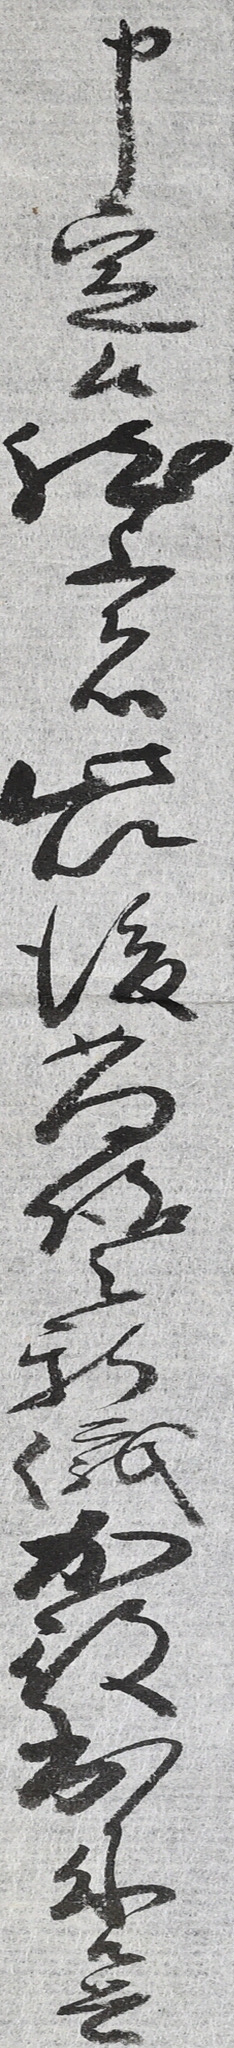申定候然上は此以後如何様之新儀加役出来候共
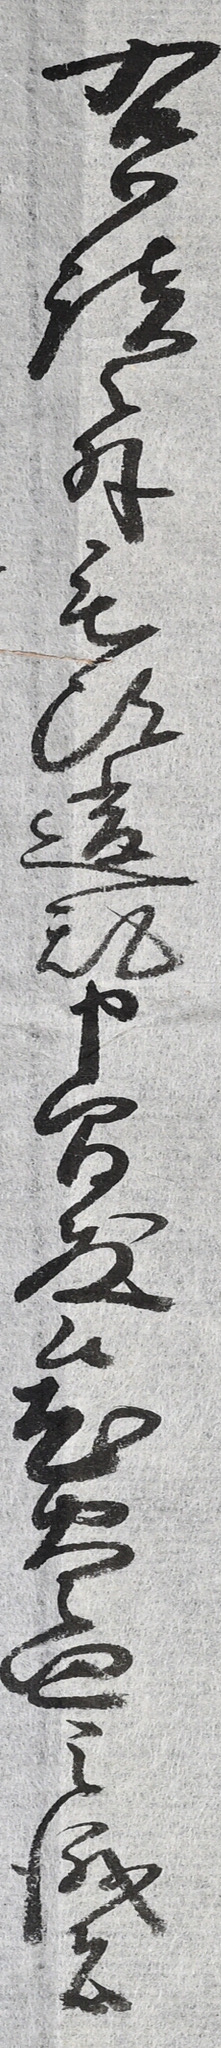右御談之外毛頭違乱申間敷候尤火之廻之儀者
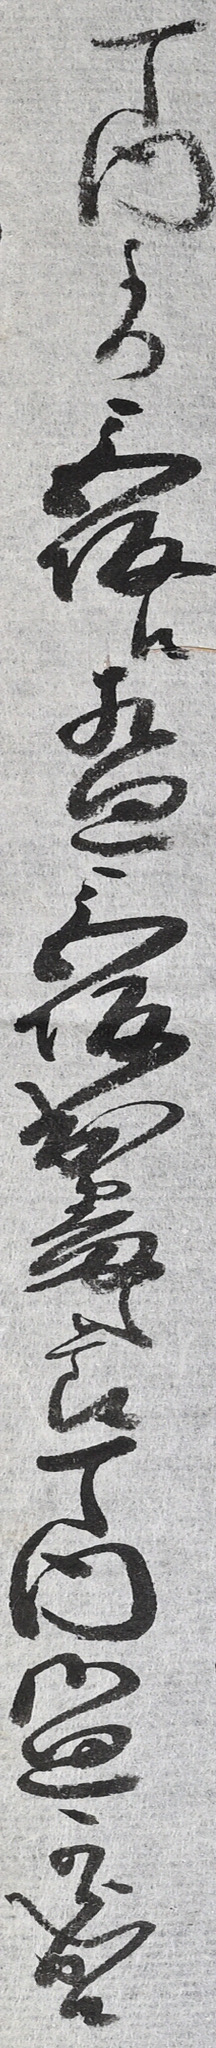丁内より宮坂江相廻宮坂出番候節丁内御廻可被成候
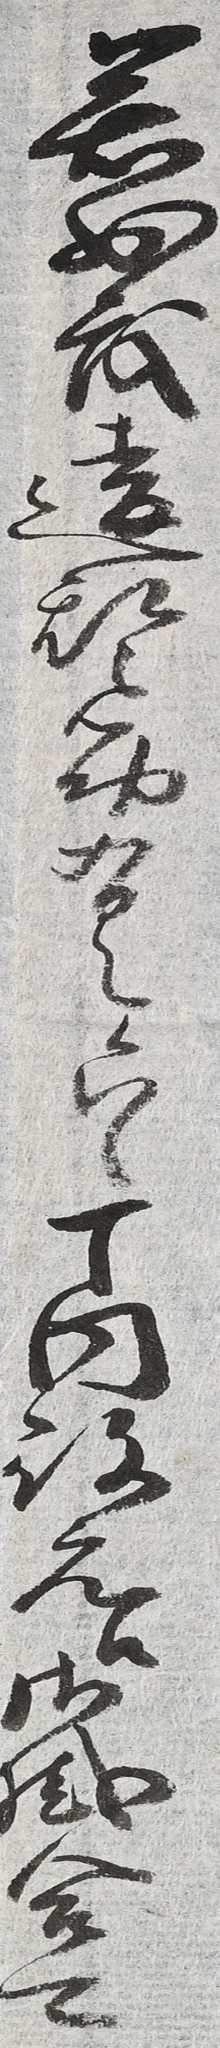若少茂違乱之筋有之候ハヽ丁内役元江御掛合可
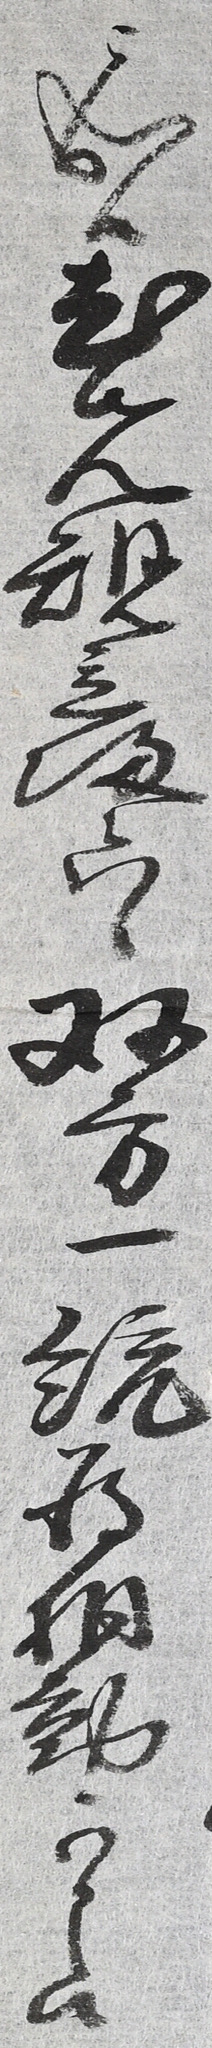被成候尤先規立帰候ハヽ双方一統為相勤可申候
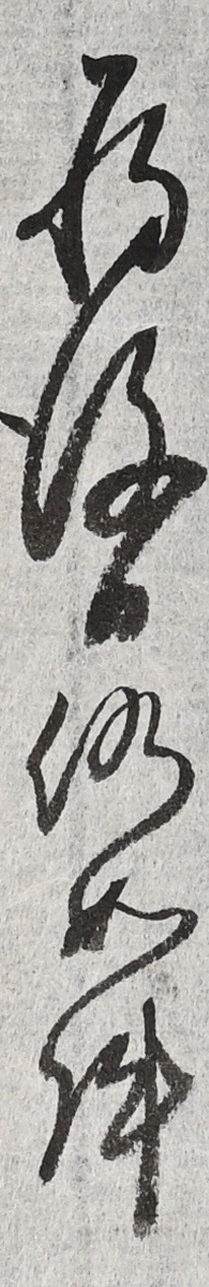為後日仍如件
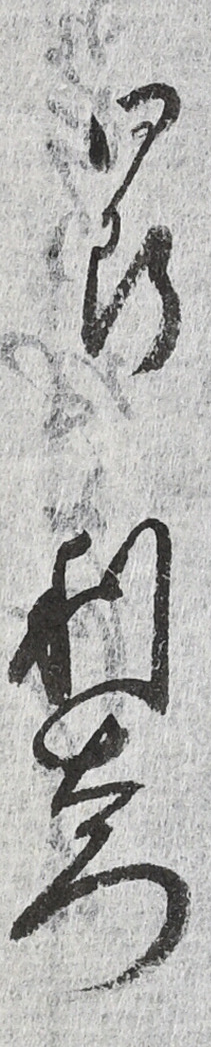同断利右衛門
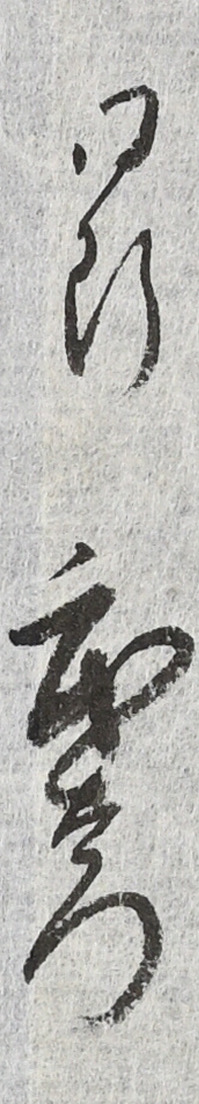同断利右衛門
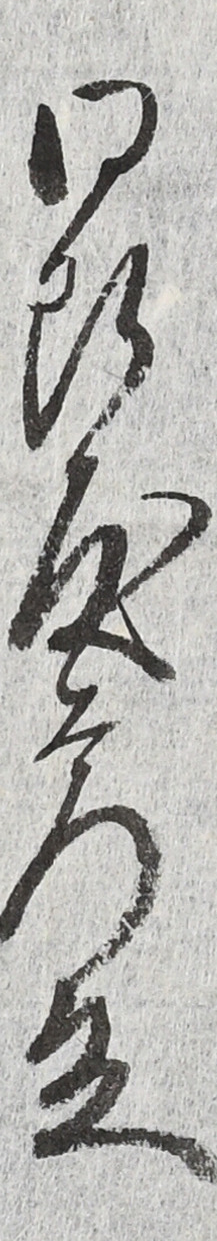同断友右衛門殿
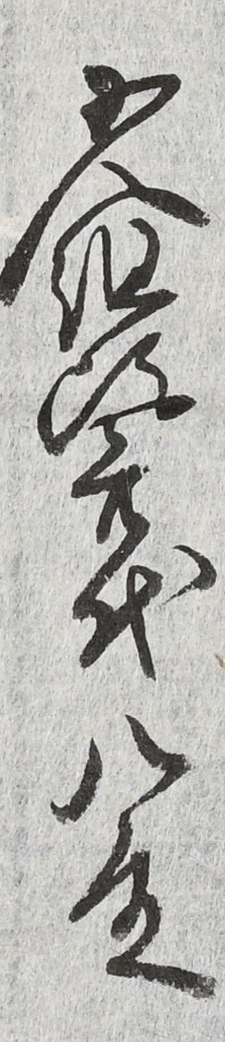五人組頭喜代八殿
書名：書違一札之事
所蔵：伊那市立高遠町図書館・合同会社AMANE
